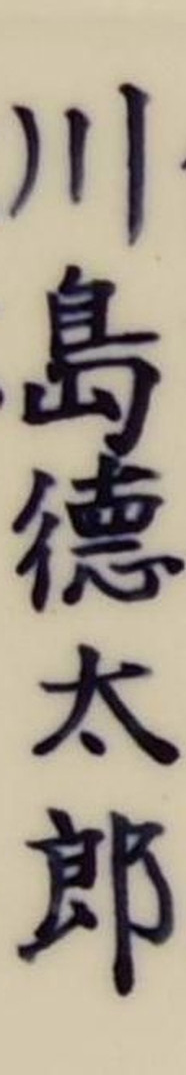川島徳太郎
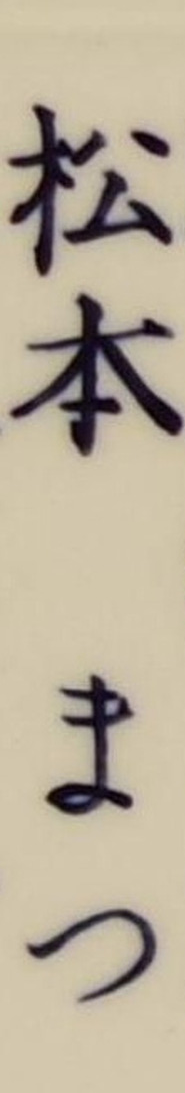松本まつ
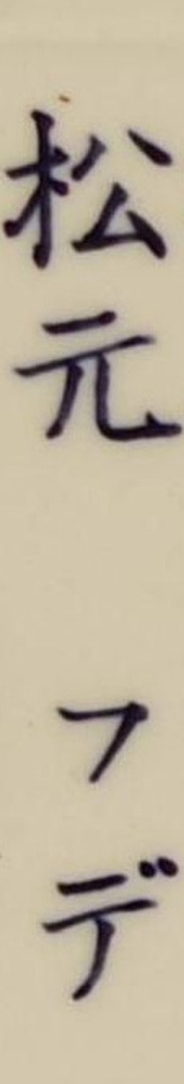松元フデ
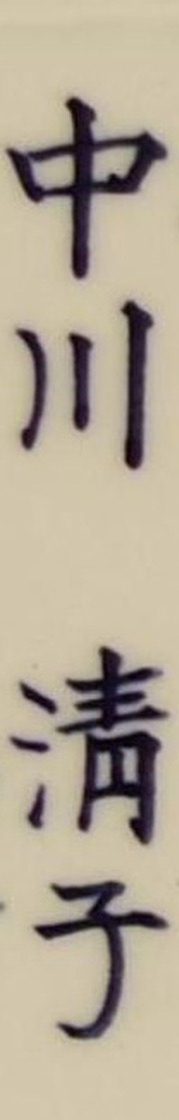中川清子
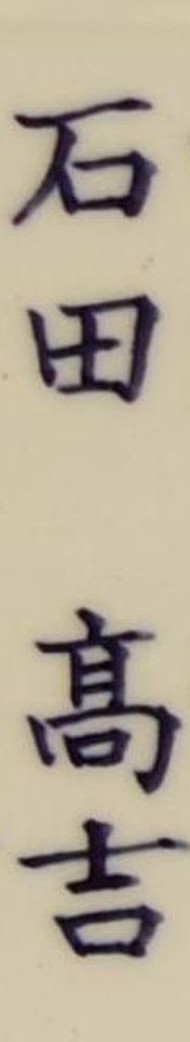石田高吉
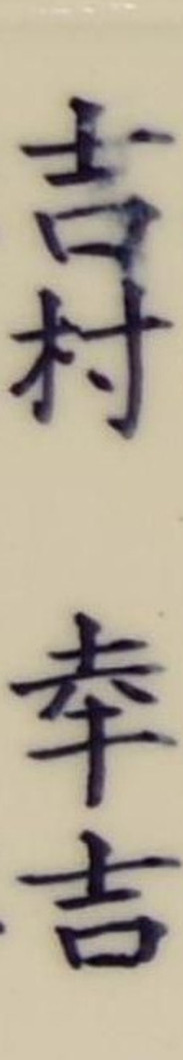吉村幸吉
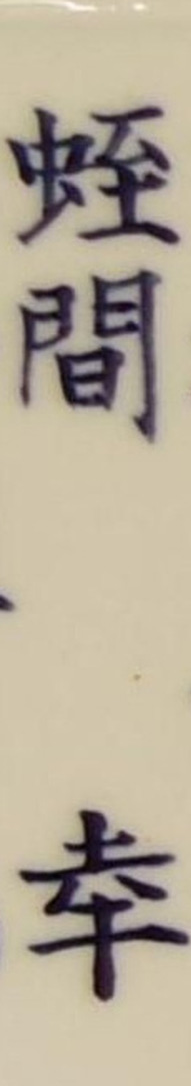蛭間幸
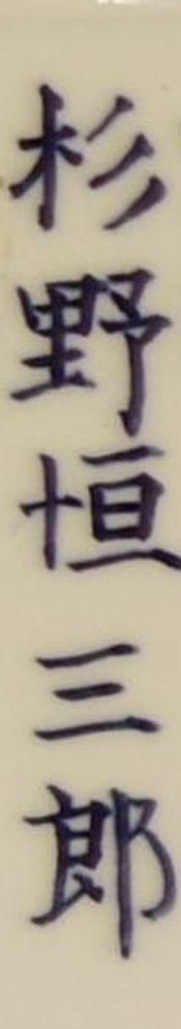杉野恒三郎
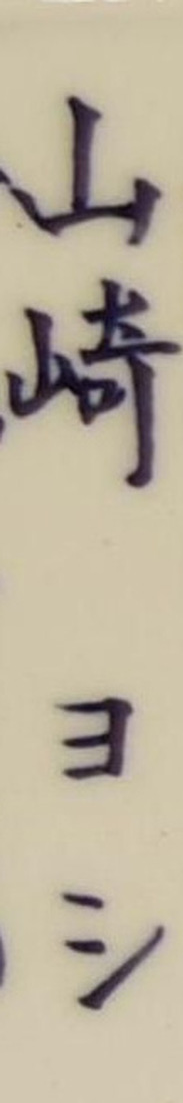山崎ヨシ
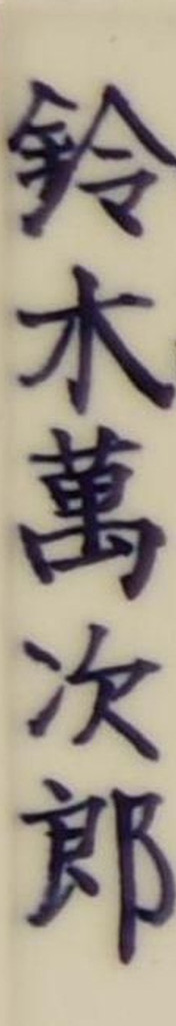鈴木萬次郎

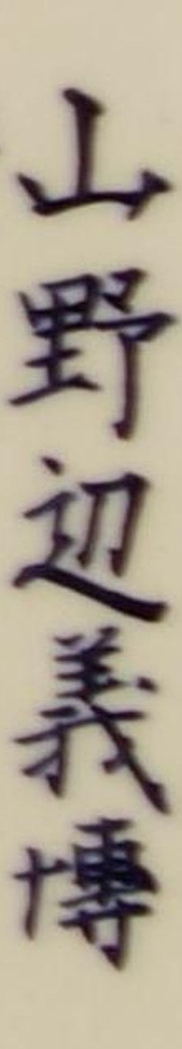山野辺義博
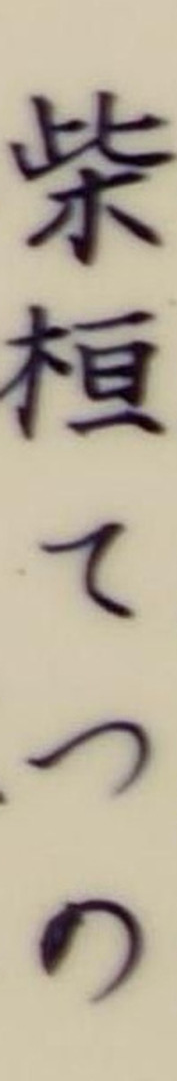紫桓てつの
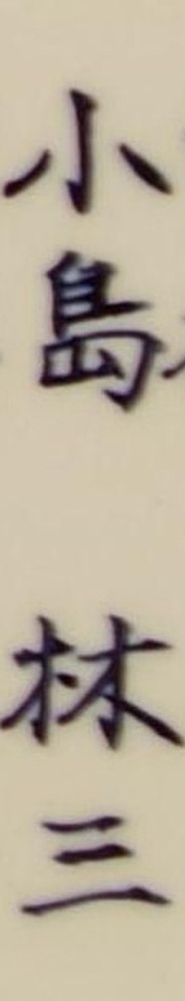小島林三
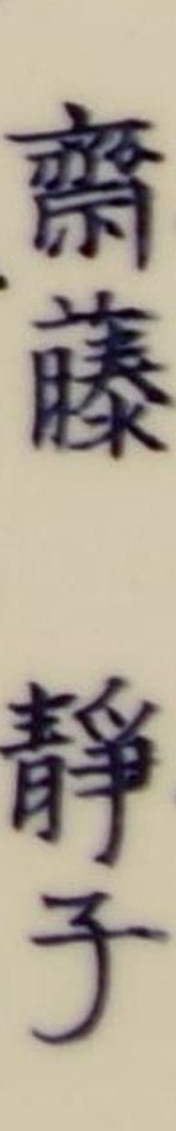斎藤静子
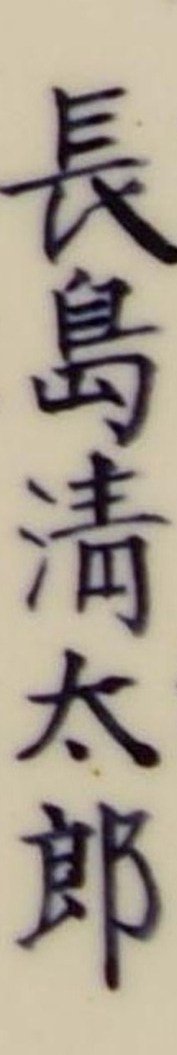長島清太郎
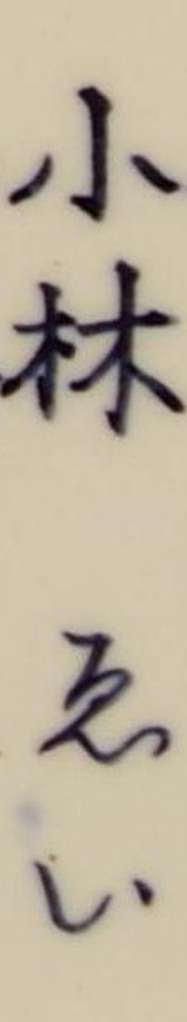小林ゑい
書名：E~L
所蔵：高野山金剛峯寺
